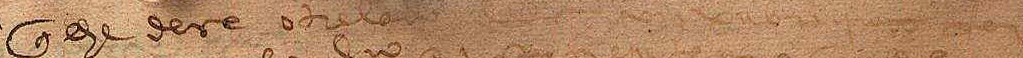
que lhe dese o trelado della com pubriqua for
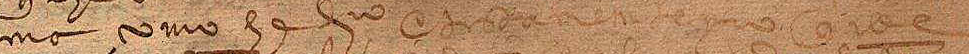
ma como he hro e testamemteyro q̄ elle
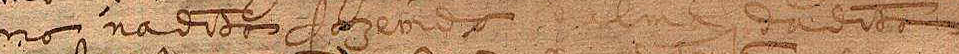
era na dita fazemda e alma da dita
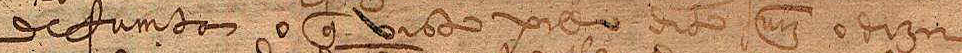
defumta o q̄ visto pello dito Juiz o dizer
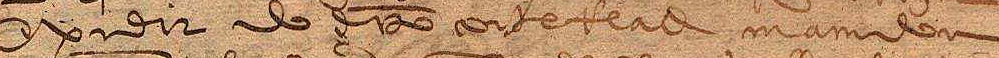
e pedir do dito corte Reall mamdou
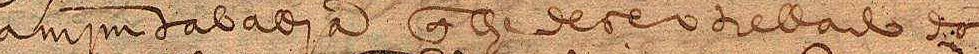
a mjm taballjam q̄ lhe dese o trellado da
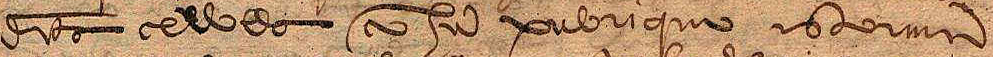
dita cedolla cō hū pubriquo estormē
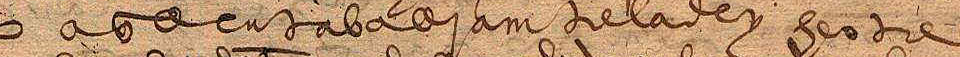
to a q̄ll eu taballjam treladey he o tre
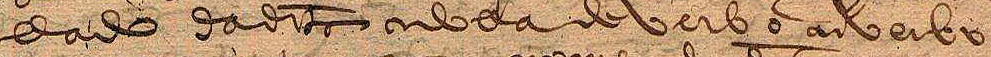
llado da dita cedolla de verbo a verbo
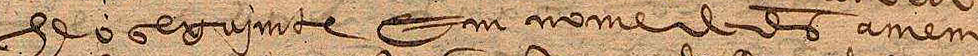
he o segujmte Em nome de d̄s amem
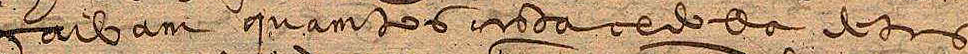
Saibam quamtos esta cedolla de tes
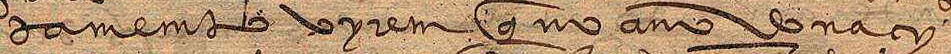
tamemto vyrem q̄ no an̄o do naçy
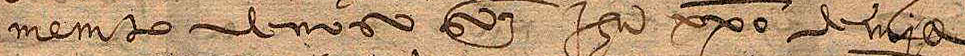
memto de noso s̄or Jhū x̄po de mjll
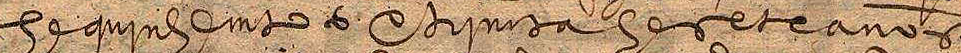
he qujnhemtos e trjmta he sete an̄os
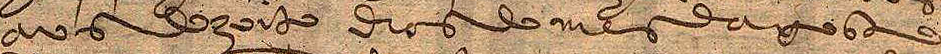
aos dezoito dias do mes dagosto
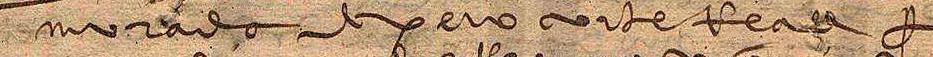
morada de pero corte Reall fy
